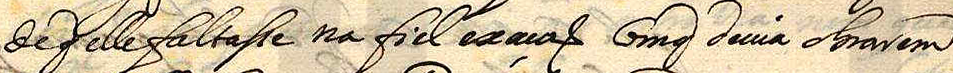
de q̄ elle faltasse na fiel exaçaõ Com q̄ deuia obrar em
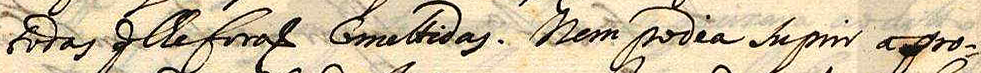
todas q̄ lhe foraõ Comettidas. nem podia suprir a pro
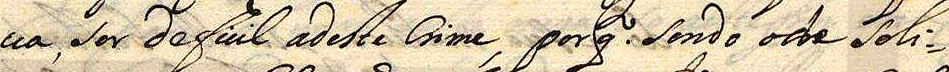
ua, ser deficil a deste Crime, porqto. sendo o de soli
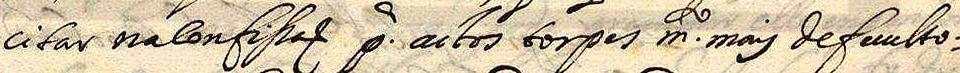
citar na confissaõ pa. actos torpes mto. mais defeculto
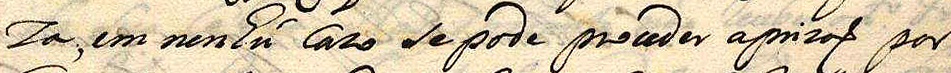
Za, em nenhū̄ Cazo se pode proceder a prizaõ por
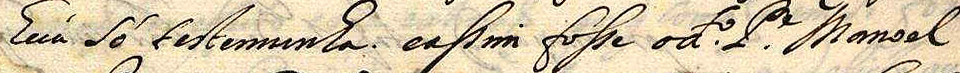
huā só testemunha. e assim fosse o do. P.e Manoel
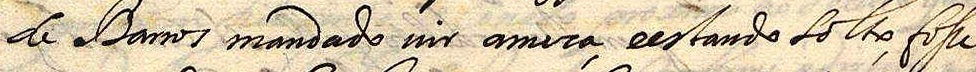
de Barros mandado uir a meza, e estando solto, fosse
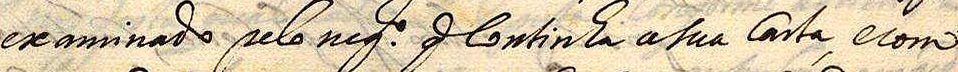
examinado pelo neg.co q̄ Continha a sua Carta, e com
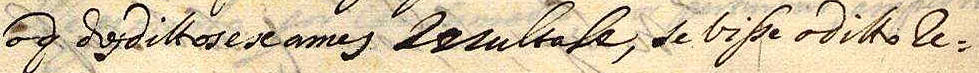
o q̄ dos dittos exames Rezultase, se visse o ditto Re
